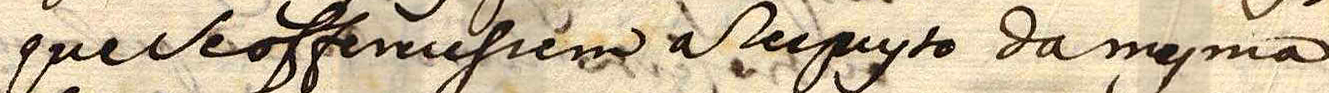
que se offerecessem a Respeyto da mesma
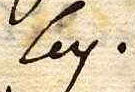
ley.
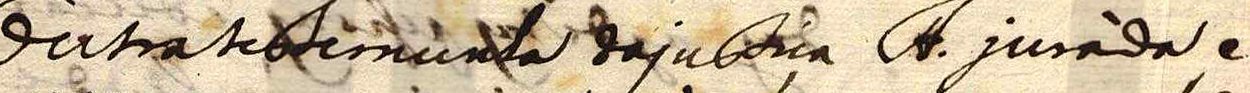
Outra testemunha da justiça A. jurada, e
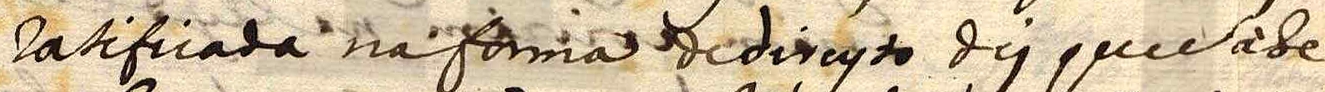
Ratificada na forma de direyto dis que sábe
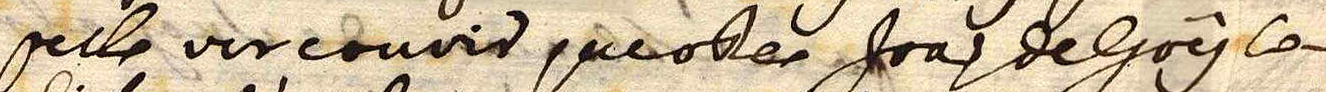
pello ver, e ouvir que o Reo Joaõ de Goês co
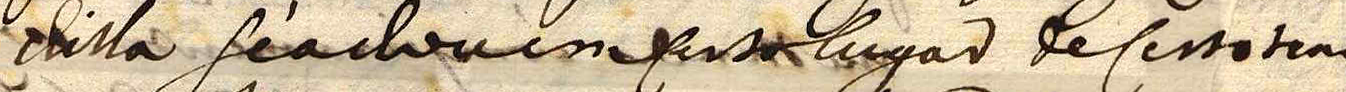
chilha se achou em Certo lugar de Certo tem
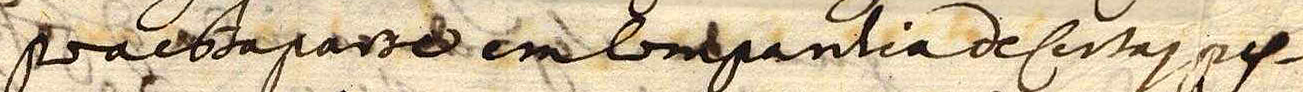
po a esta parte em Companhia de Certas pes
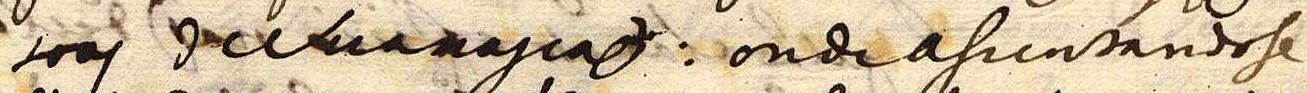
soas de sua nasçaõ: onde assentandose
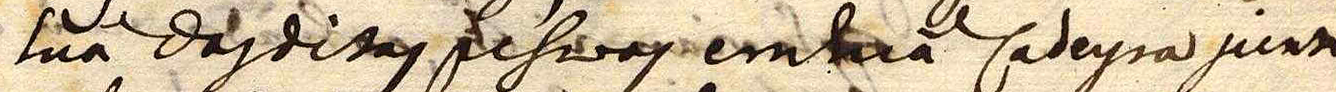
huã das ditas pessoas em huã Cadeyra junto
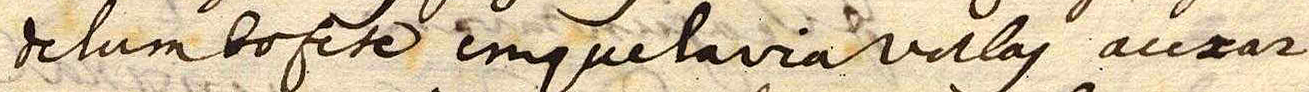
de hum bofete em que havia vellas acezas
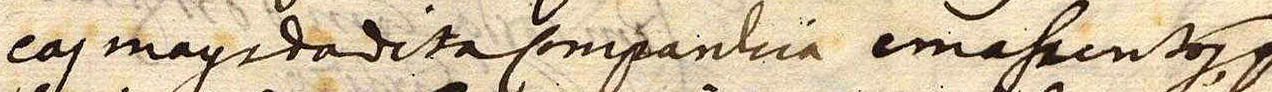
e as mays da dita Companhia em assentos, q̄
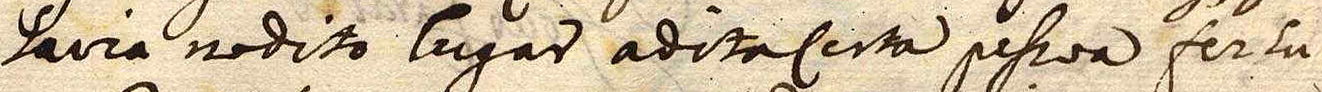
havia no dito lugar a dita Certa pessoa fez hu
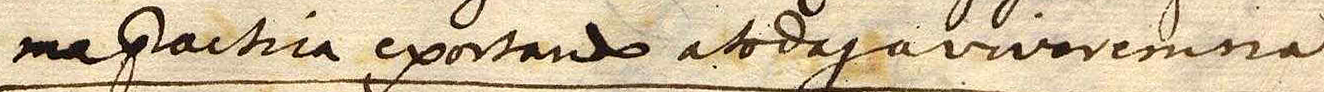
ma practica exortando a todas a viver em na
